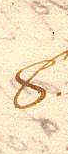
8.
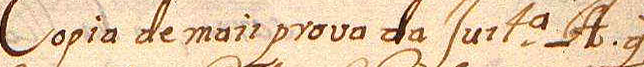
Copia de mais prova da Just.a A. q̄
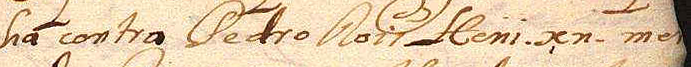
ha contra Pedro Roiz̄ Hen̄s̄ x n - mer
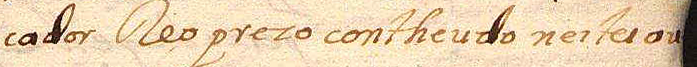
cador Reo prezo contheudo nestes au
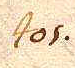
tos.
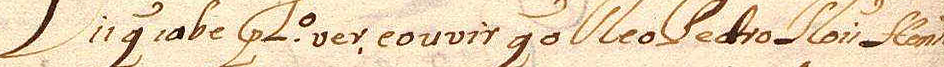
Dis q̄ sabe pL.o ver, e ouvir q̄ o Reo Pedro Rois̄ Hens̄
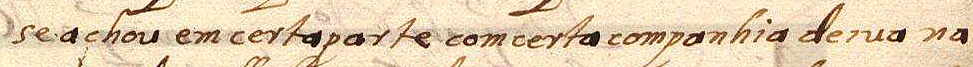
se achou em certa parte com certa companhia de sua na
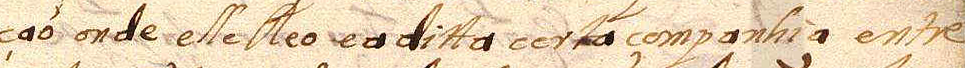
çaõ onde elle Reo e a ditta certa companhia entre
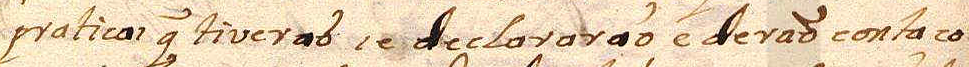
praticas q̄ tiveraõ se declararaõ, e deraõ conta co
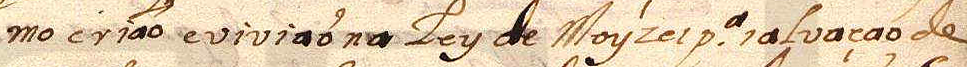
mo criaõ e viviaõ na Ley de Moyzes p.a salvaçaõ de
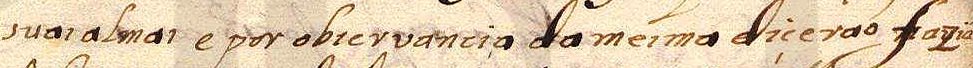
suas almas e por observancia da mesma diçeraõ fazião
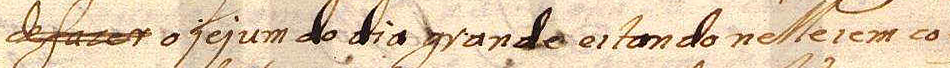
de fazer o jejum do dia grande estando nelle sem co
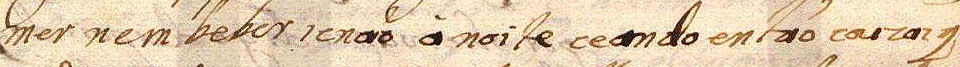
mer nem beber senaõ á noite ceando entaõ couzas q̄
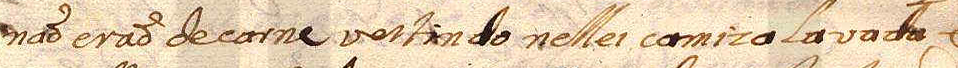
naõ eraõ de carne vestindo nelles camiza Lavada e
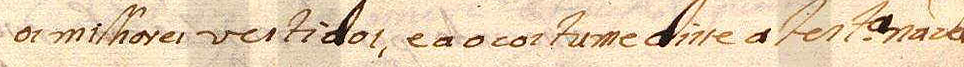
os milhores vestidos, e ao costume disse a test.a nada.
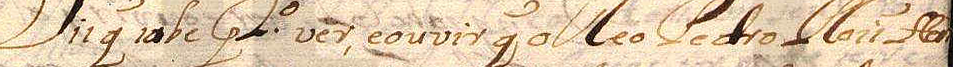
Diz q̄ sabe pL.o ver, e ouvir q̄ o Reo Pedro Rois̄ Hen
